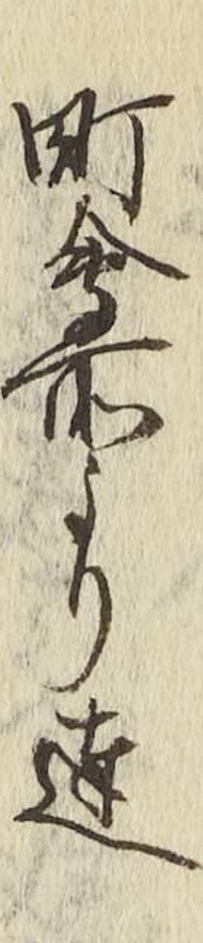町会所より達
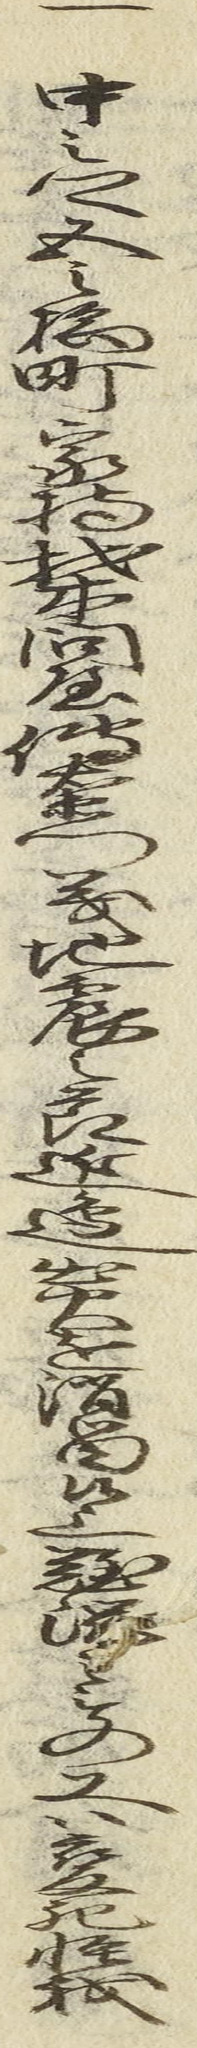一中之郷五之橋町家持材木問屋伝右衛門義地震之節近辺出火を消留候上難渋之もの又は変死怪我
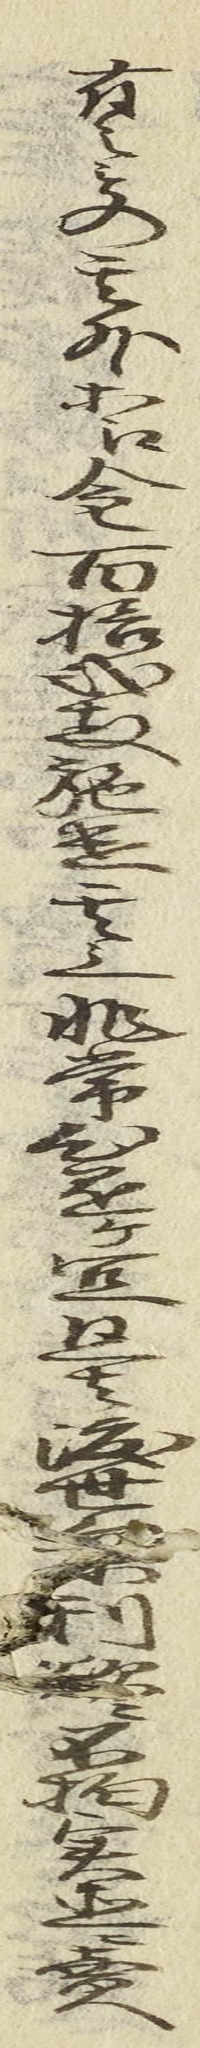有之もの其外等江金百拾弐両施遣其上非常心懸ケ宜且者渡世利欲ニ不拘実直ニ売
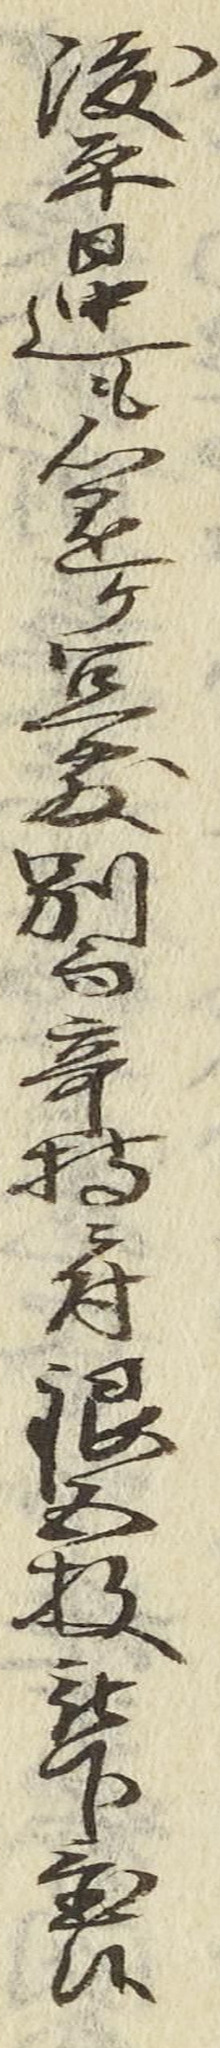渡平日迚も心懸ケ宜敷別而奇特ニ付銀五枚被下置候
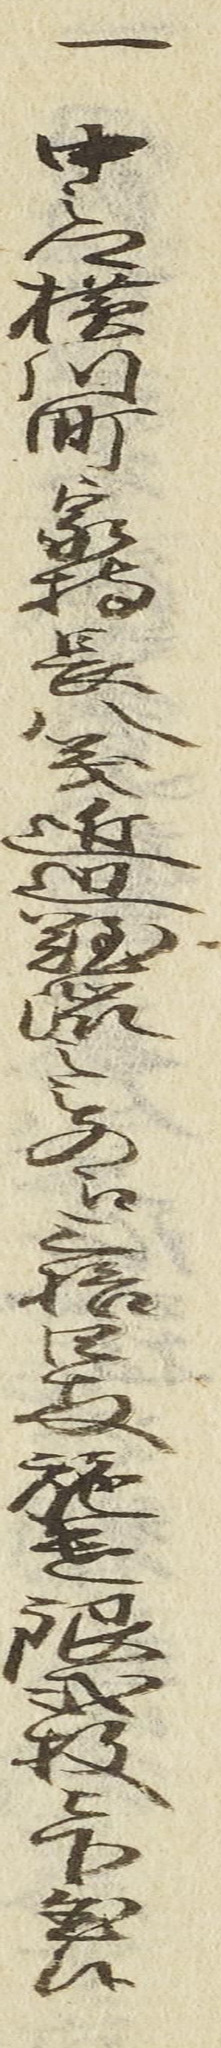一中之郷横川町家持長八義近辺難渋之もの江三拾四両施遣銀弐枚被下置候
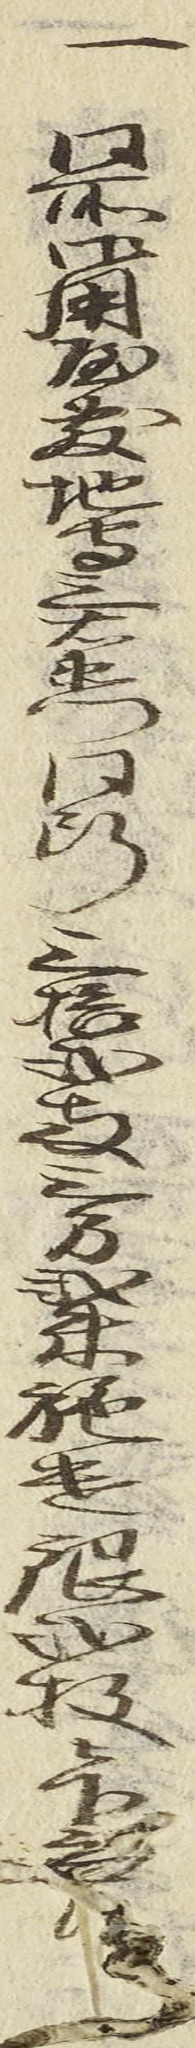一同所御用屋敷地守三右衛門同断三拾弐両三分弐朱施遣銀壱枚被下置候
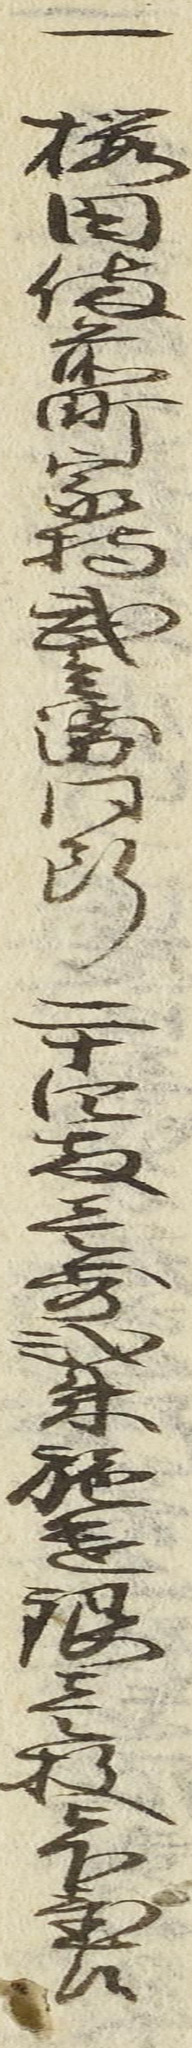一桜田備前町家持武兵衛同断二十四両壱歩弐朱施遣銀壱枚被下置候
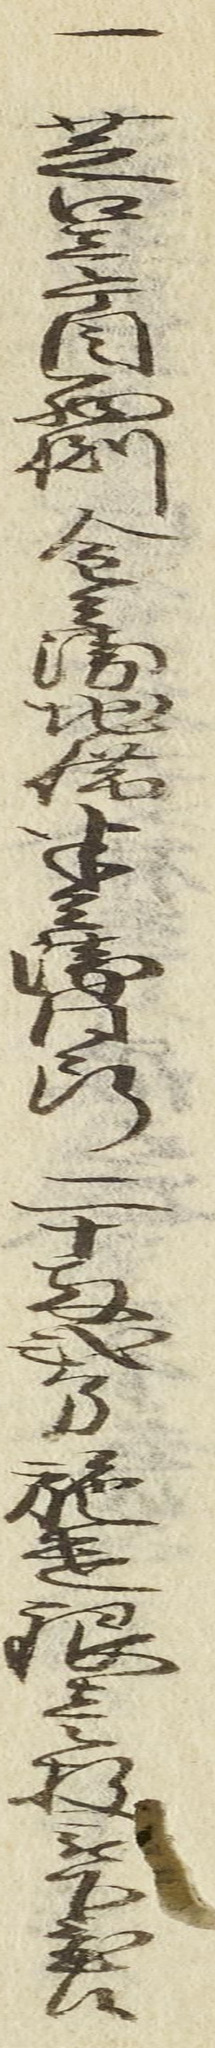一芝口壱丁目西側金兵衛地借半兵衛同断二十両弐分施遣銀壱枚被下置候
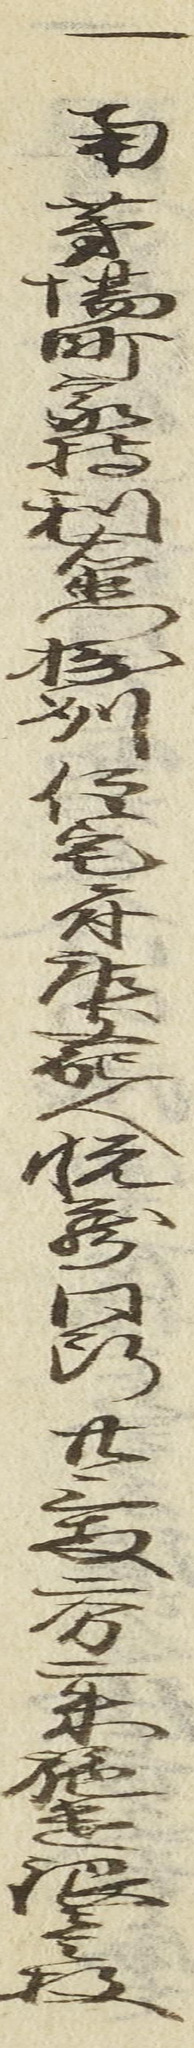一南茅場町家持利右衛門摂州住宅ニ付店支配人悦蔵同断廿三両二分二朱施遣銀壱枚
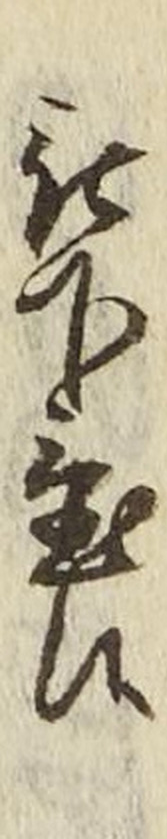被下置候
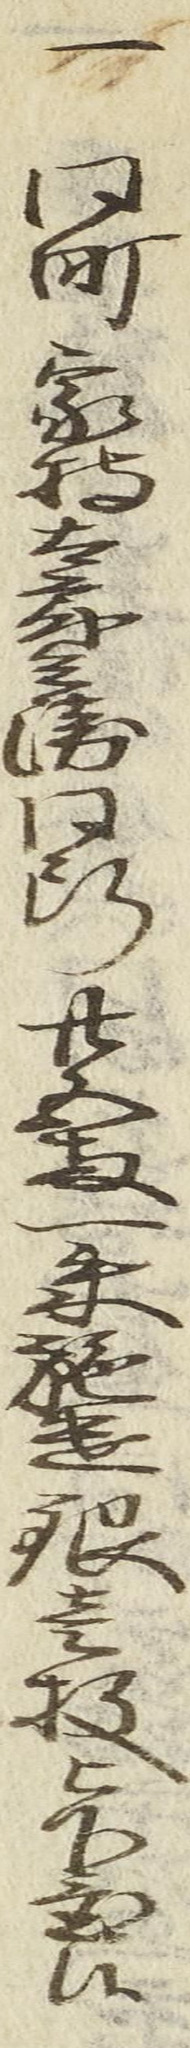一同町家持太郎兵衛同断廿五両一朱施遣銀壱枚被下置候
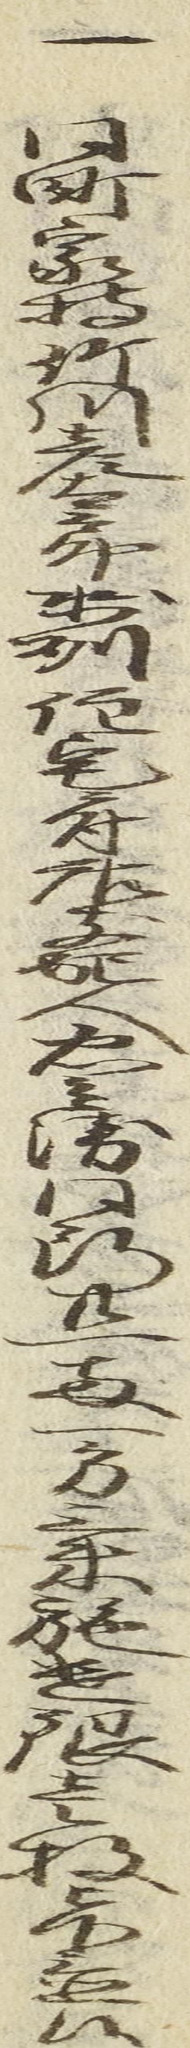一同町家持竹川彦太郎勢州住宅ニ付店支配人忠兵衛同断廿一両一分三朱施遣銀壱枚被下置候
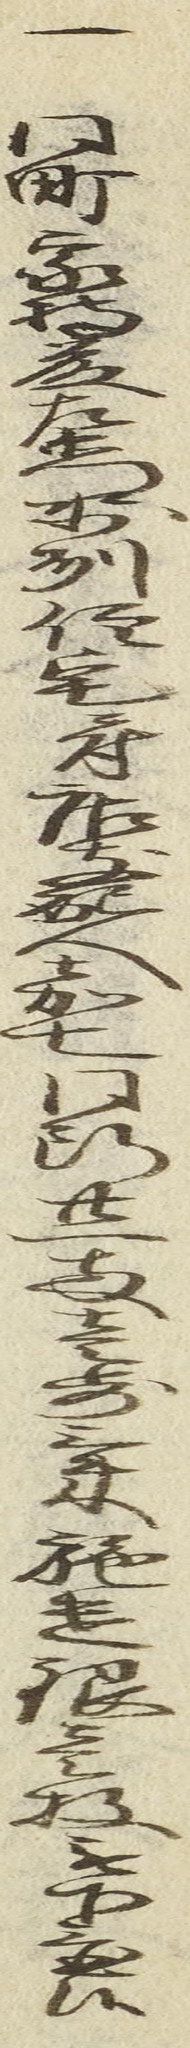一同町家持藤左衛門勢州住宅ニ付店支配人嘉七同断廿一両壱歩三朱施遣銀壱枚被下置候
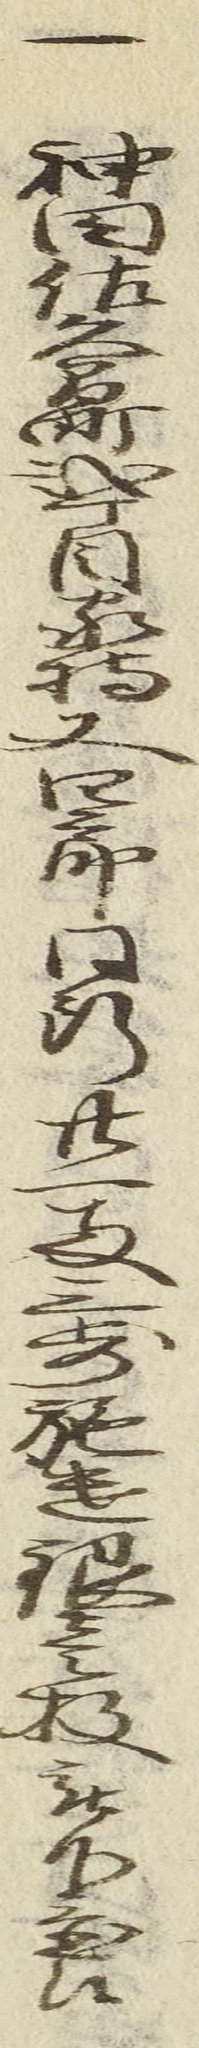一神田佐久間町弐丁目家持又四郎同断廿一両三歩施遣銀壱枚被下置候
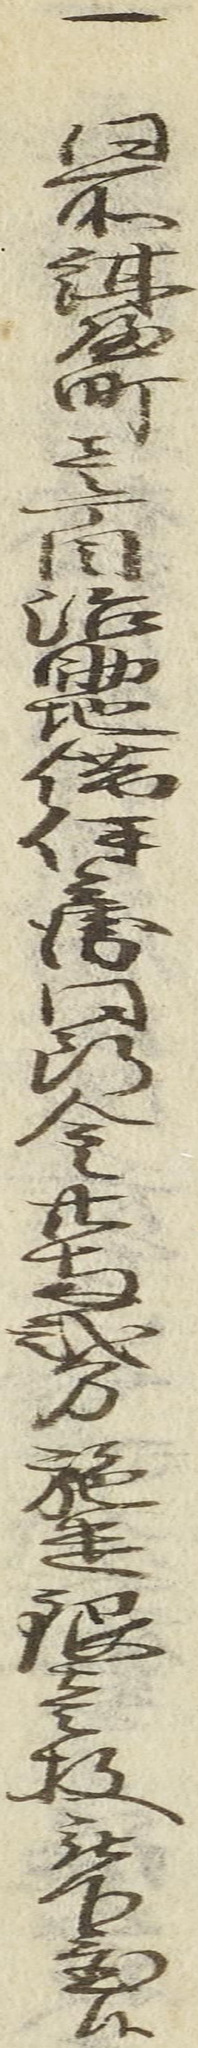一同所紺屋町壱丁目治助地借伊兵衛同断金廿両弐分施遣銀壱枚被下置候
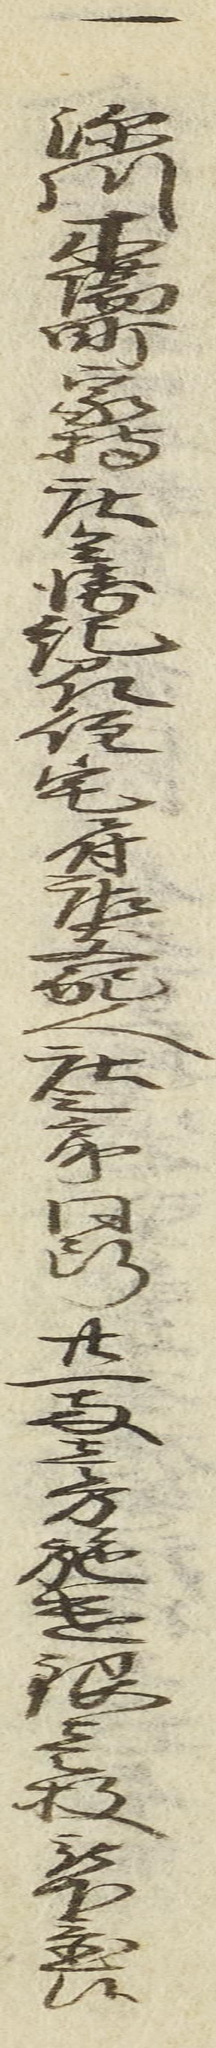一深川木場町家持庄兵衛紀州住宅ニ付店支配人庄三郎同断廿一両壱分施遣銀壱枚被下置候
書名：安政二年震災記事　完
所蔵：東京大学地震研究所図書室 Earthquake Research Institute Library, The University of Tokyo, JAPAN
